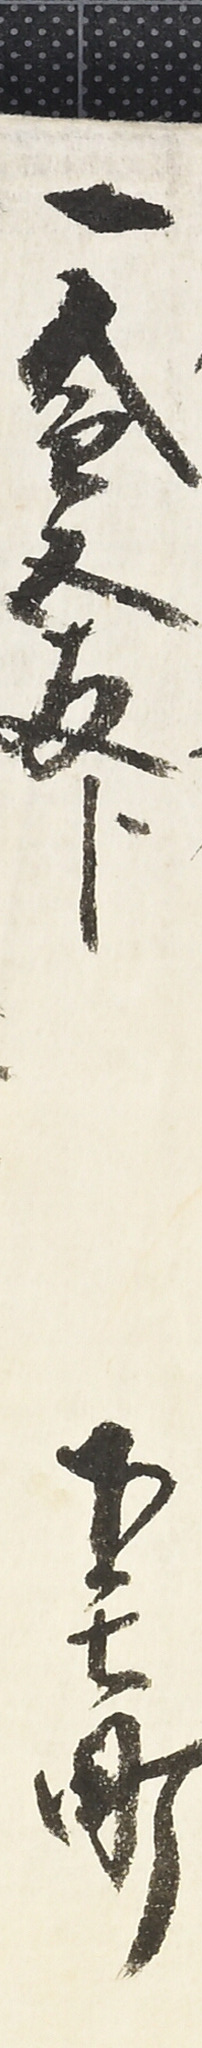一金五両ト下モ町
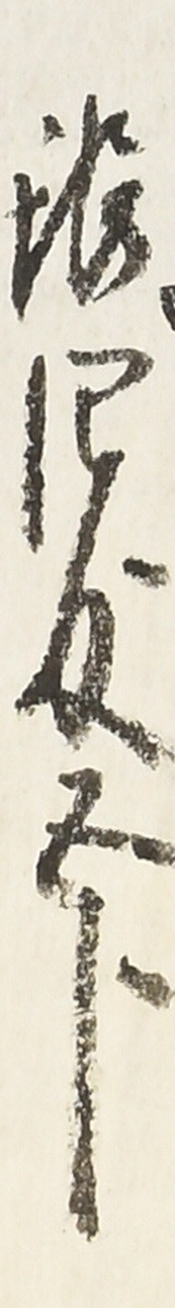銀四匁五分
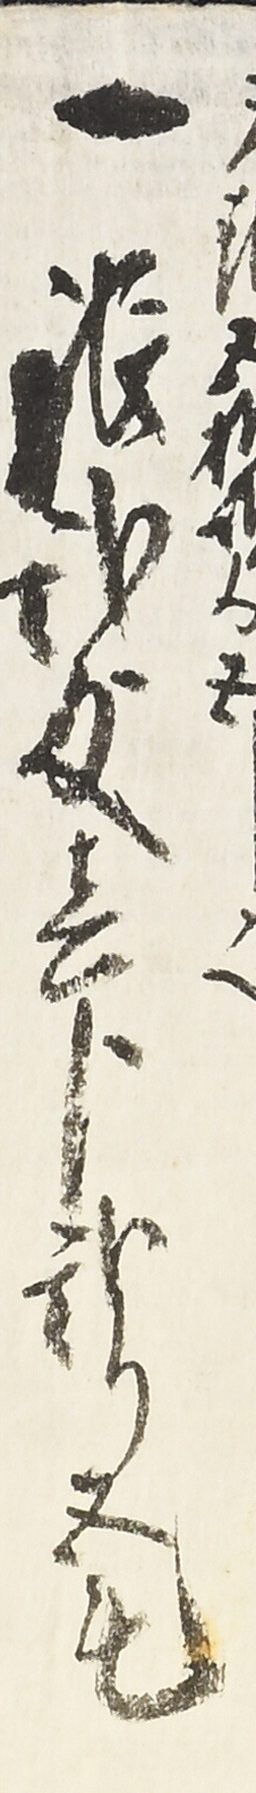一銀弐匁壱分弐厘五毛
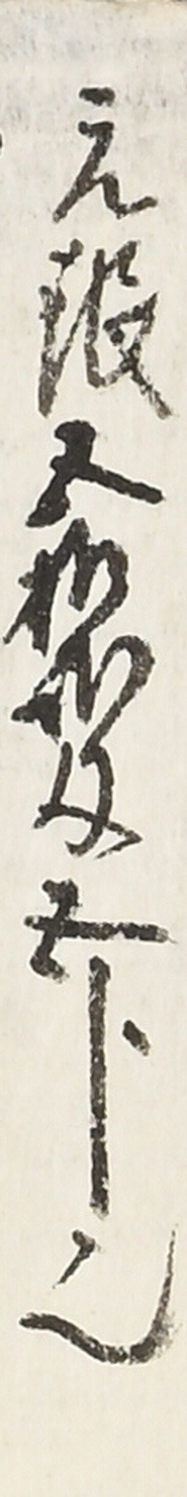元銀五拾弐匁五分也
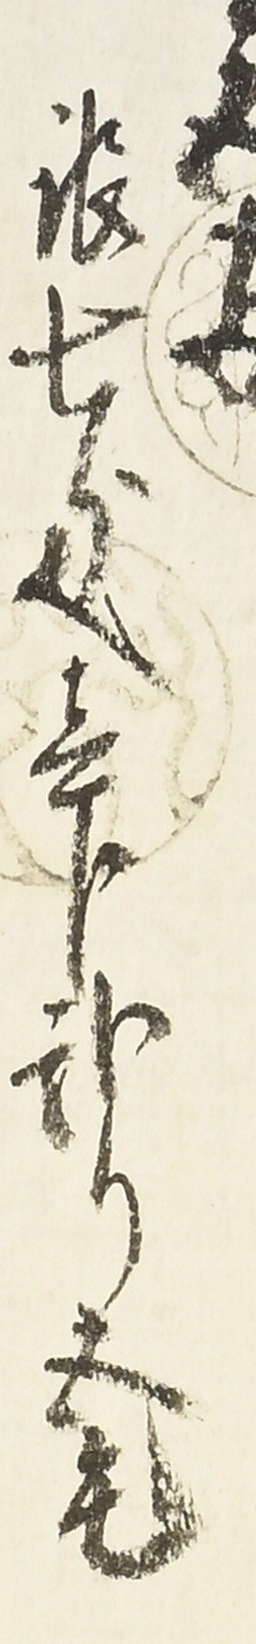銀七匁壱分弐厘五毛
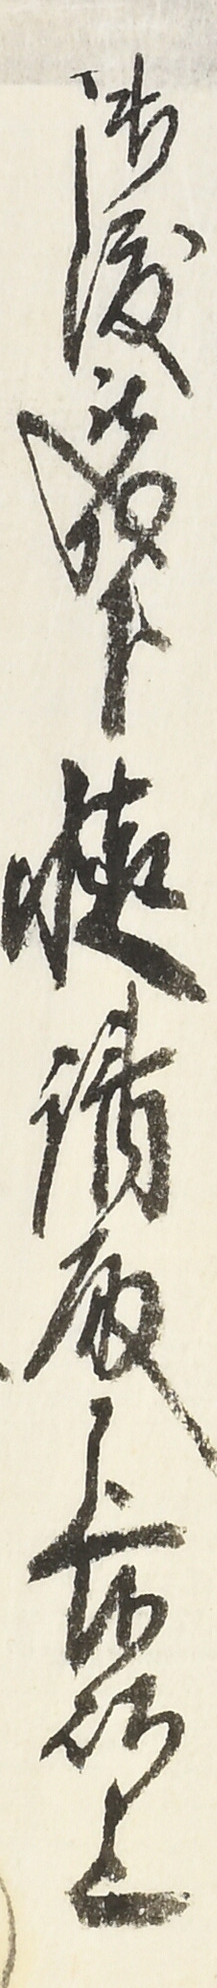御渡被成下慥請取申上候以上
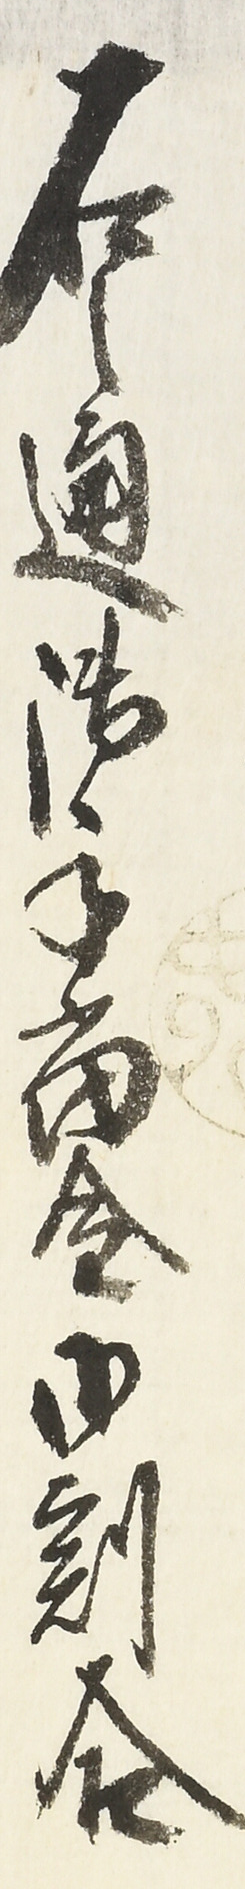右之通御手当金御割合
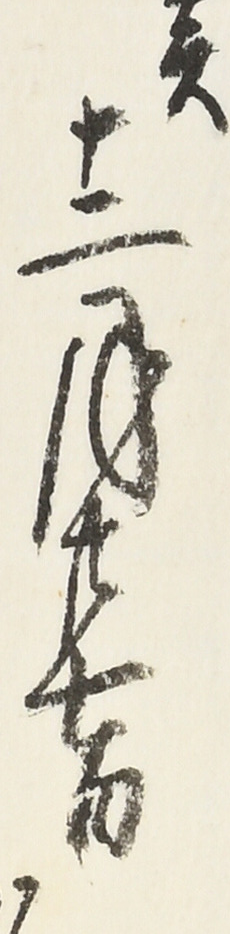十二月廿七日同断
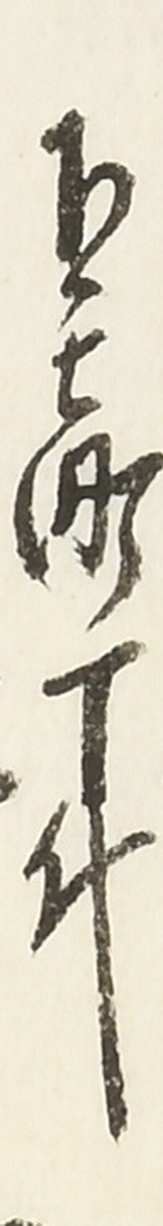下モ町丁代
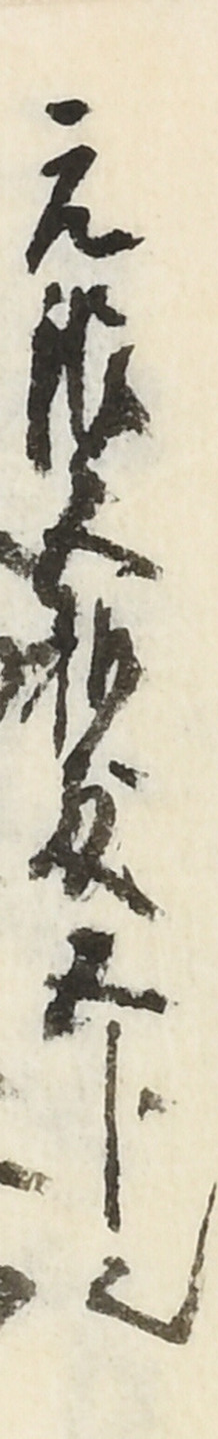元銀五拾弐匁五分也
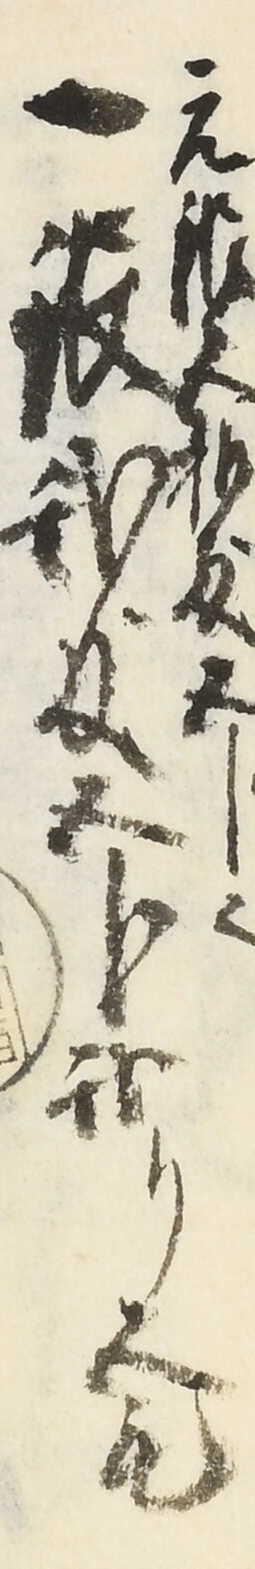一銀弐匁壱分弐厘五毛

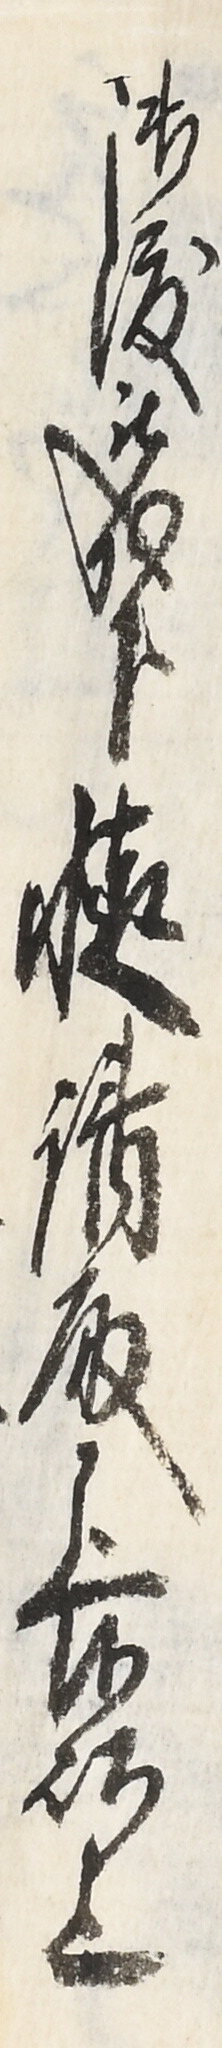御渡被成下慥請取申上候以上
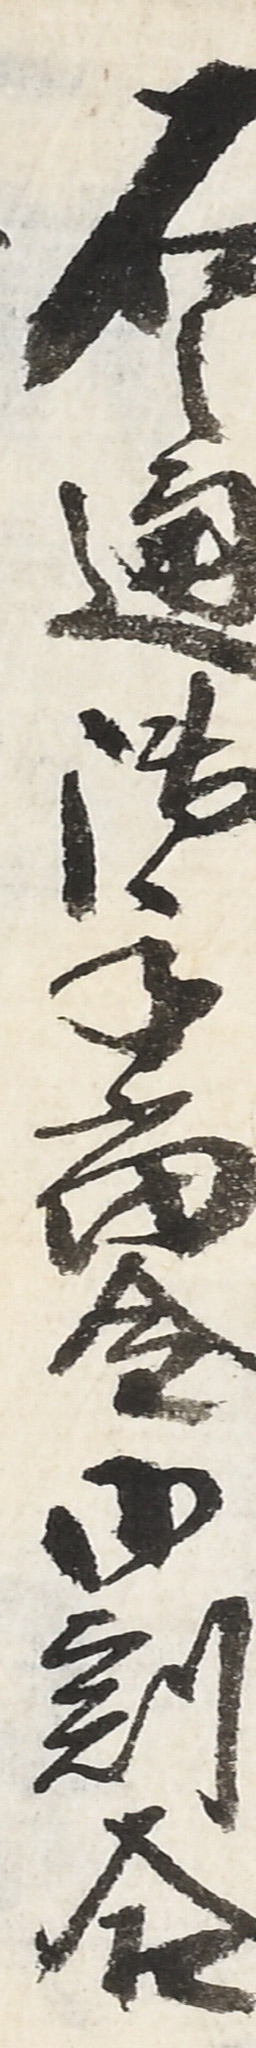右之通御手当金御割合
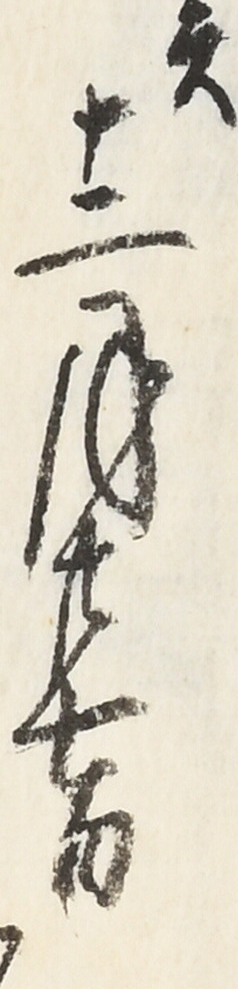十二月廿七日同断
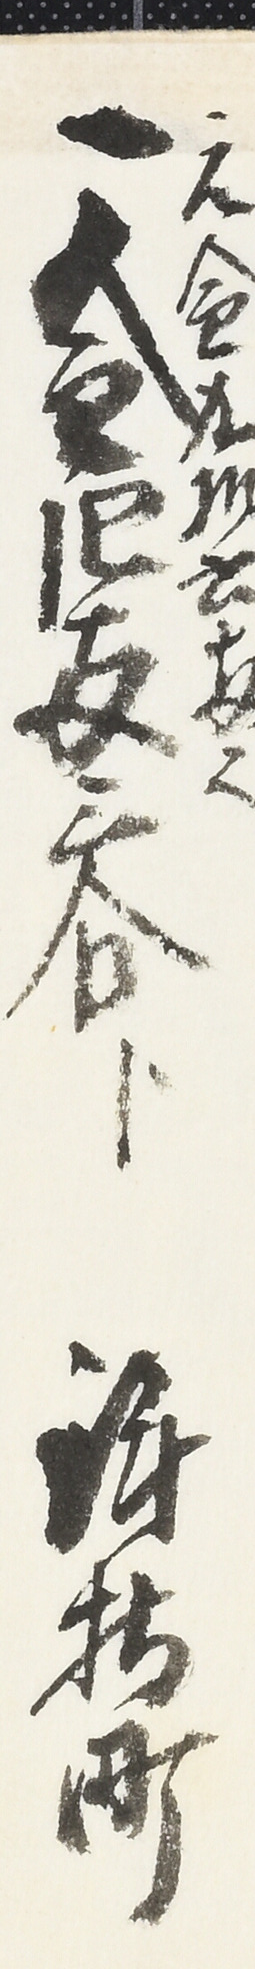一金四両三分ト鉾持町
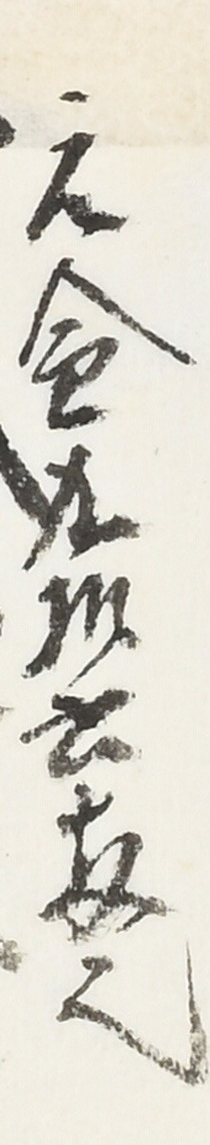元金九拾六両也
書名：御才覚金御利足割渡扣帳
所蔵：伊那市立高遠町図書館・合同会社AMANE
